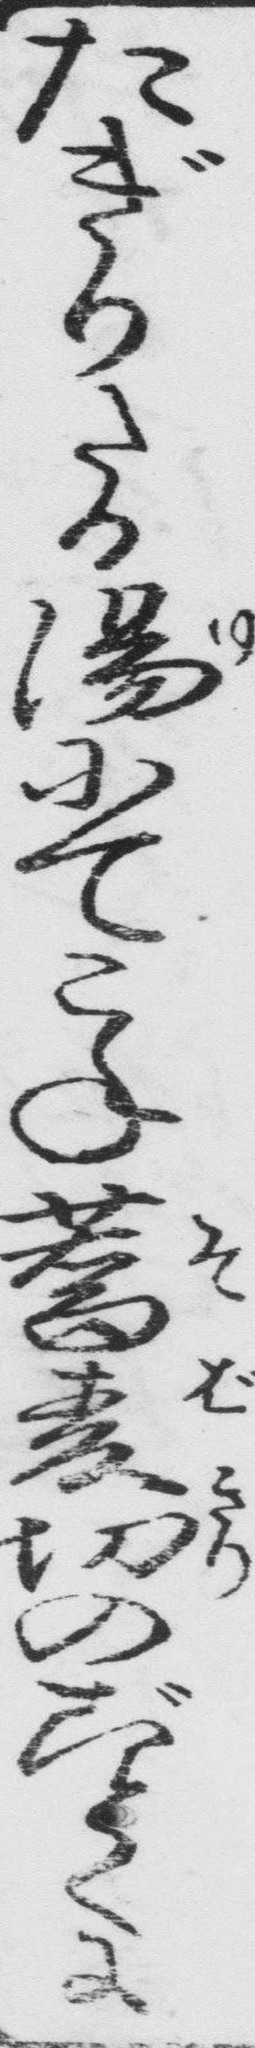たぎりたる湯にてこね蕎麦切のごとくに

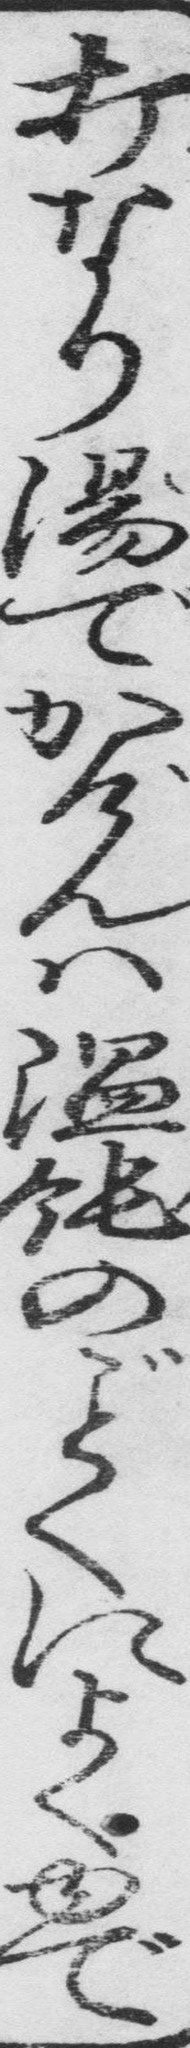打なり湯でかげんは饂飩のごとくによくゆで
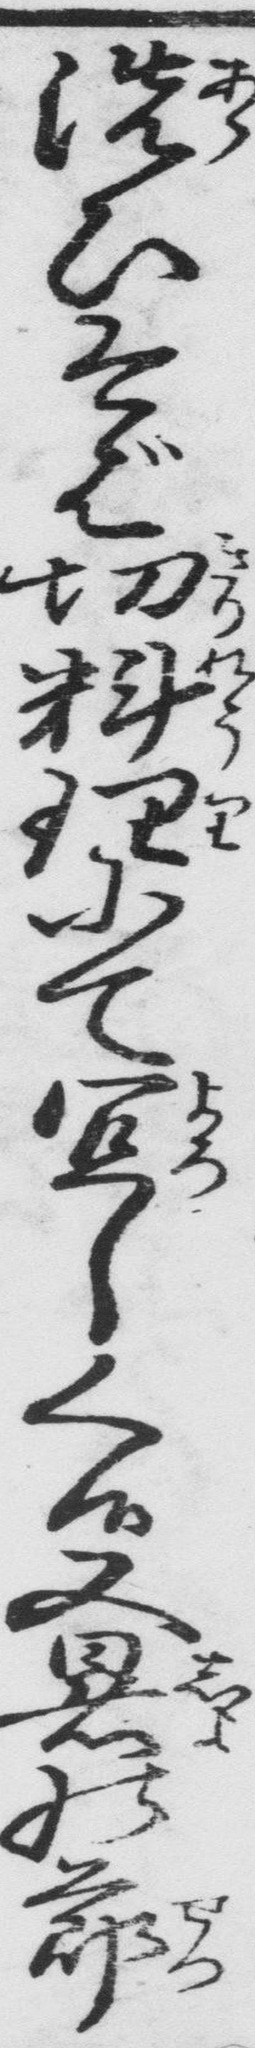洗ひそば切料理にて宜しく候又暑の節
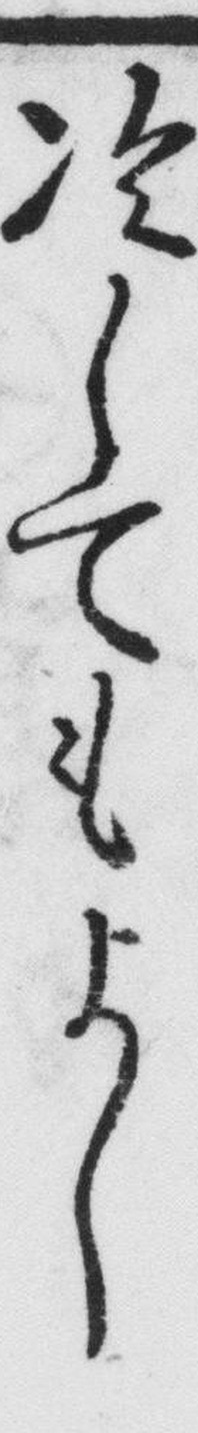冷してもよし
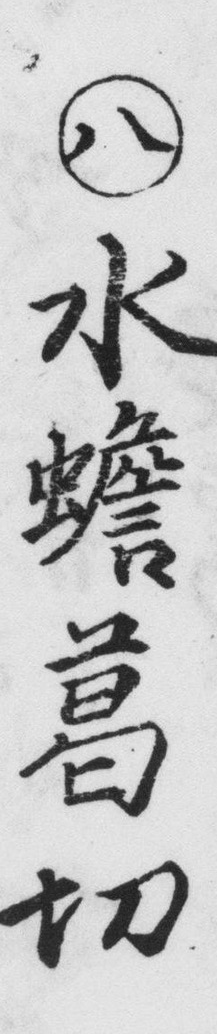(八)水蟾葛切
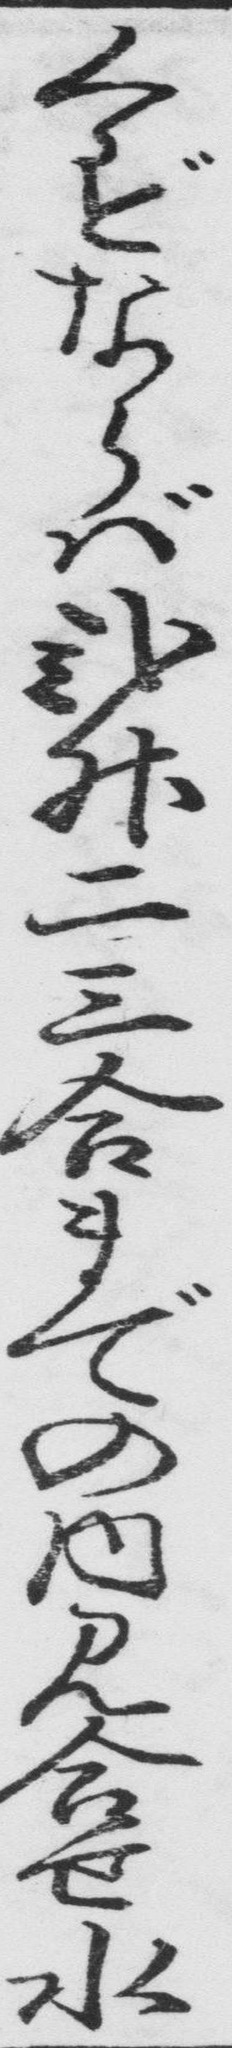くずならば弐升二三合までの内見合せ水
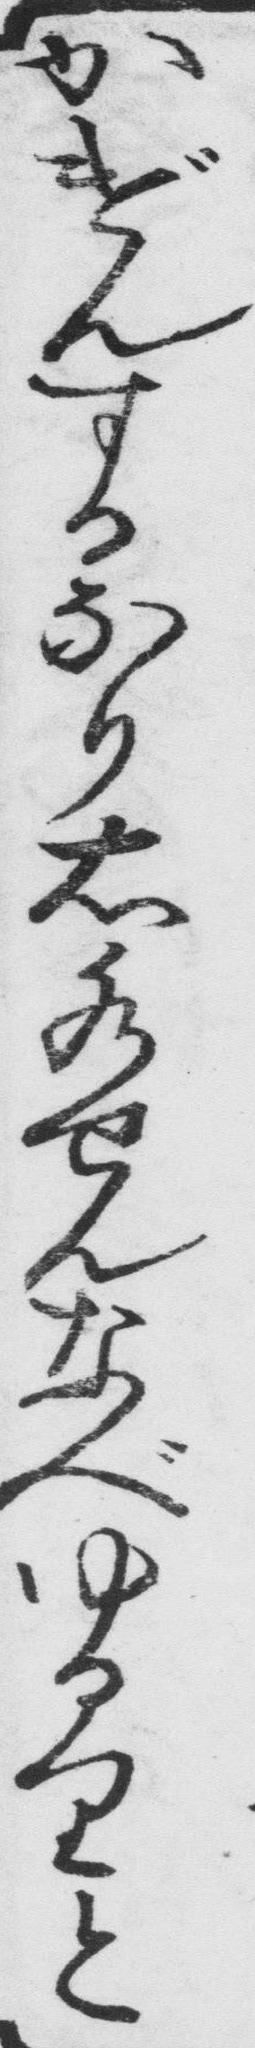かげんするなり右水せんなべゆるりと
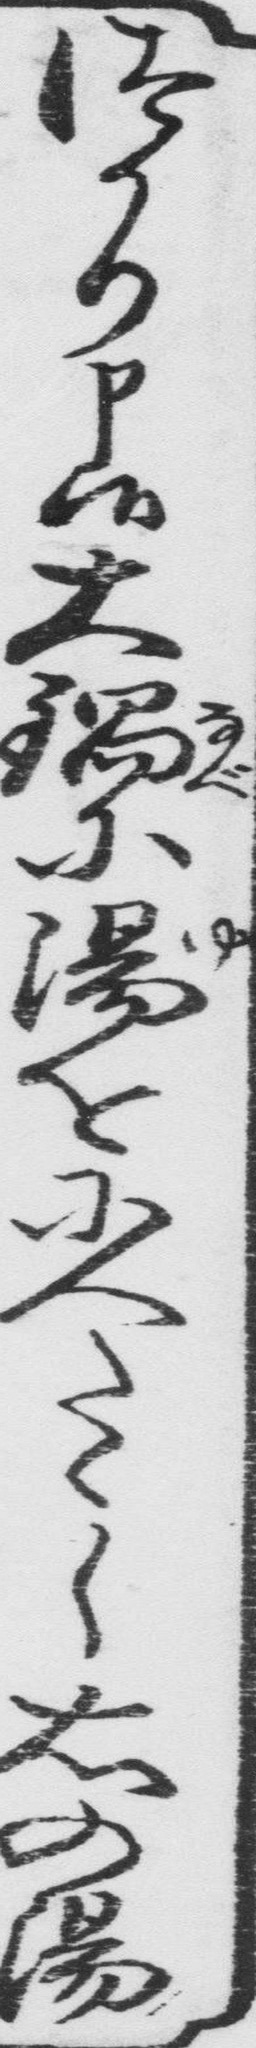つかり申候大鍋に湯をにへたゝし右の湯
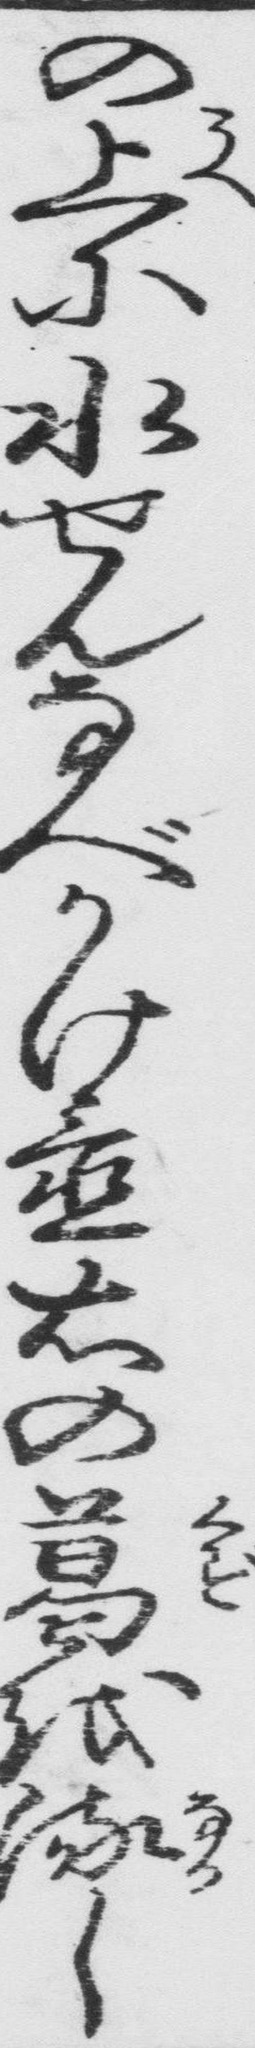の上に水せんなべかけ置右の葛を流し
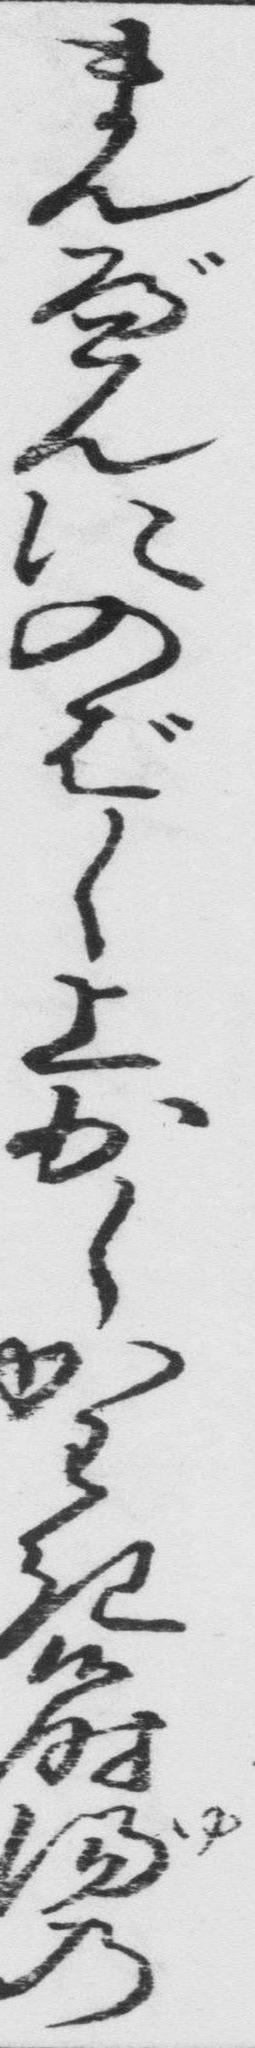まんべんにのばし上少しかわき候時湯の
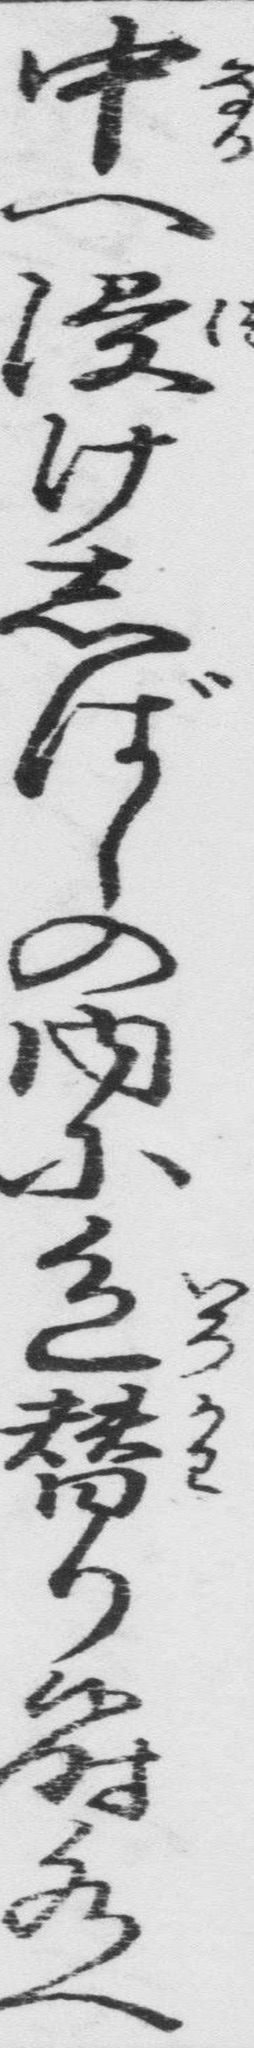中へ浸けしばしの内に色替り候時水へ
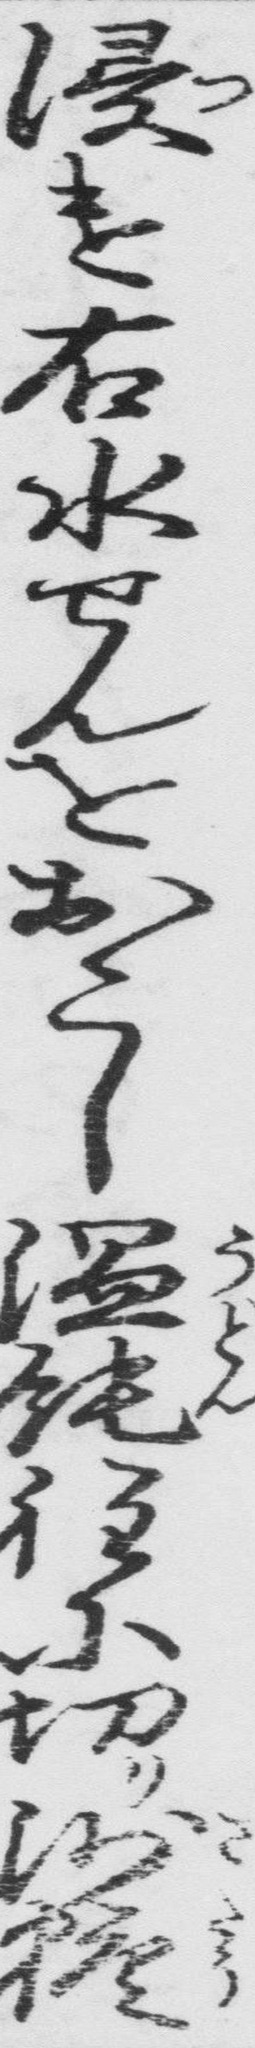浸け右水せんをおこし饂飩程に切り沙糖
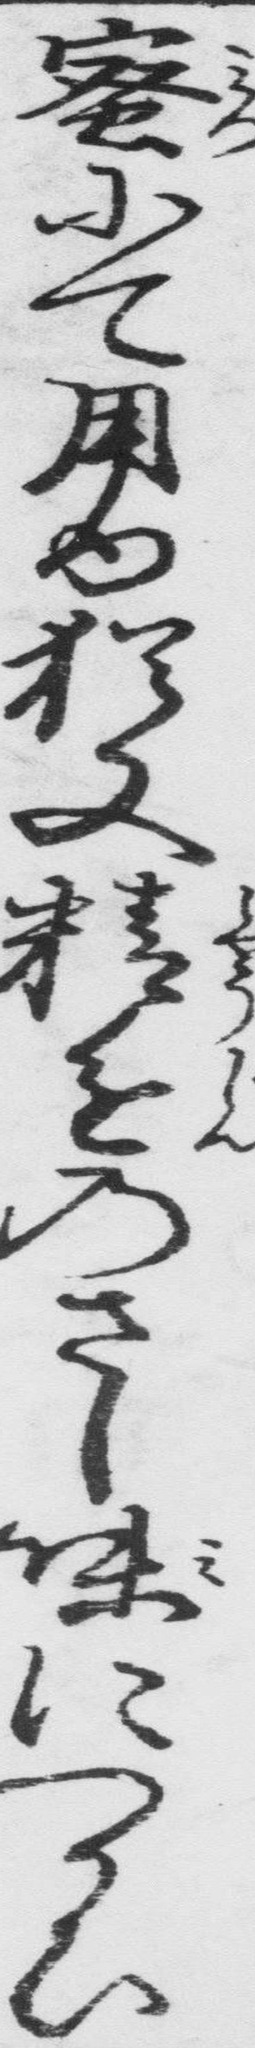蜜にて用ゆ猶又精進のさし味につかひ
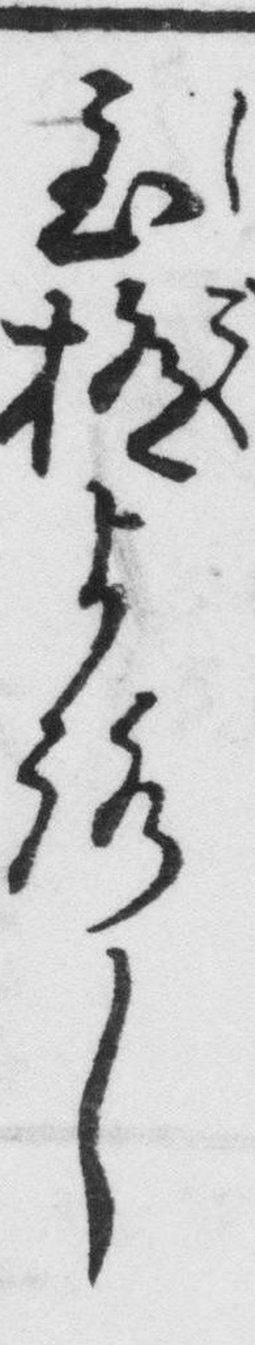至極よろし

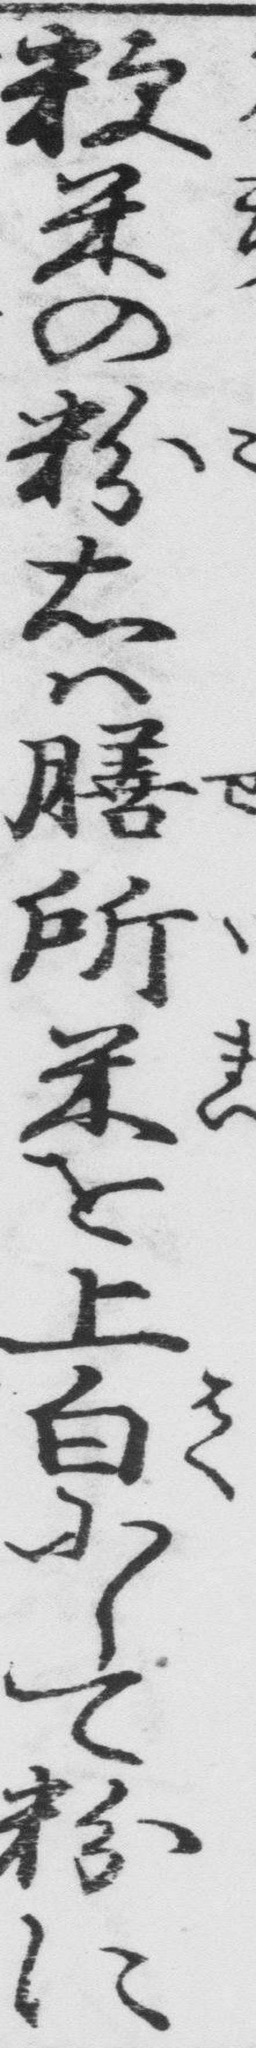粳米の粉右は膳所米を上白にして粉に
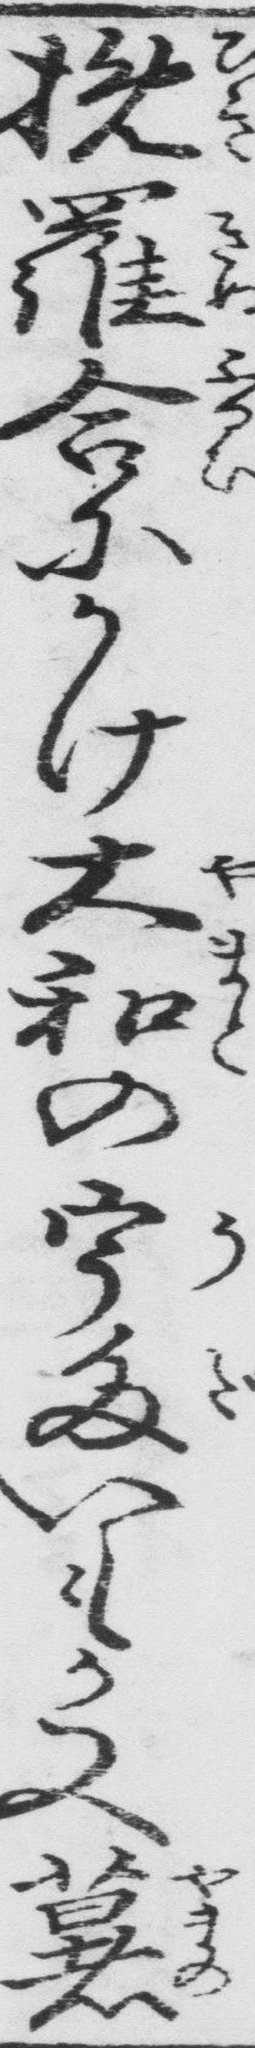挽羅合にかけ大和の宇多いもか又薯
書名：御前菓子図式
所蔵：大阪府立大学学術情報センター 国文学研究資料館
